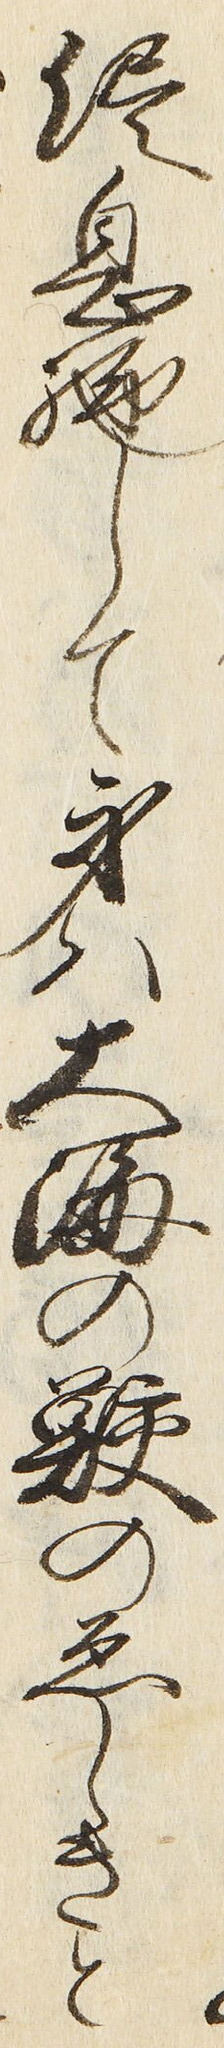侭息絶して身は大海の鯨のえしきと
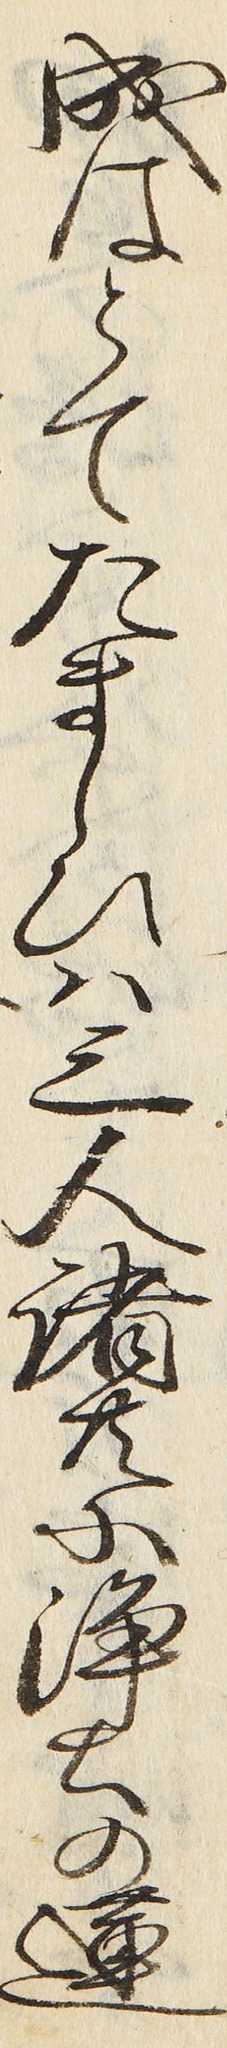成はとてたましひは三人諸共に浄土の蓮
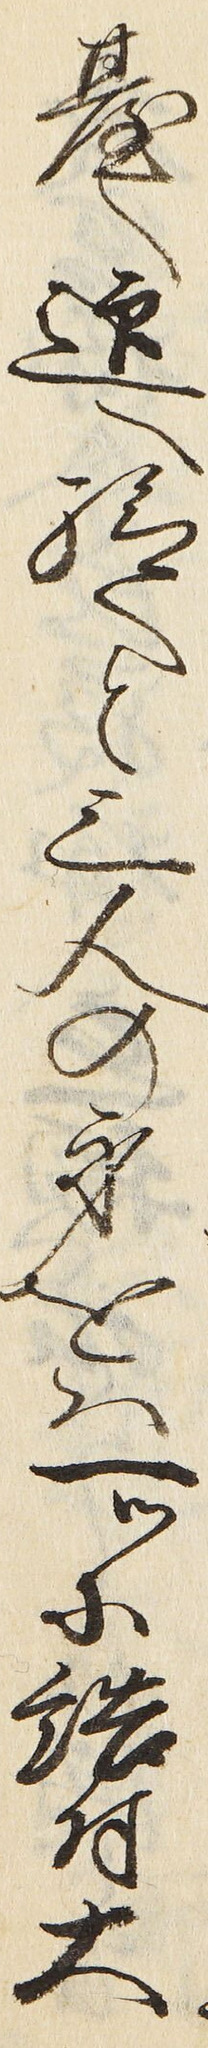基へ向へ給へと三人の身をは一ッに結付大
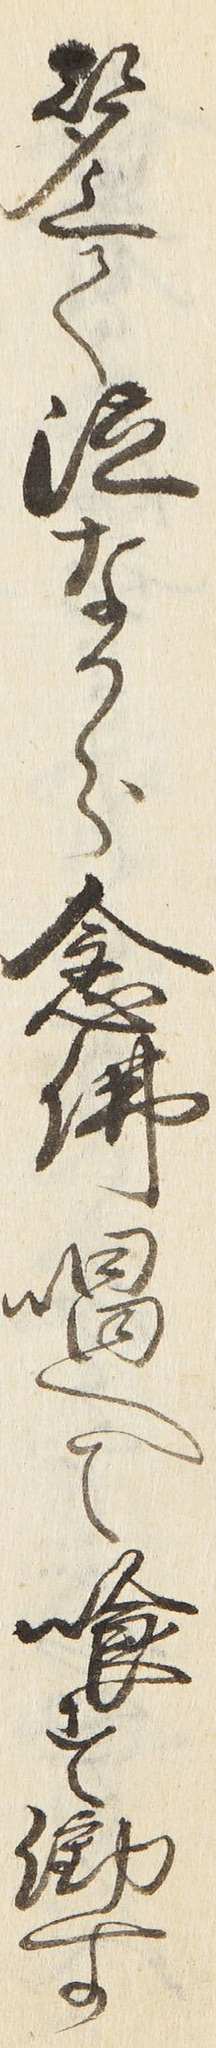声上て泣ながら念仏唱へて喰す働す
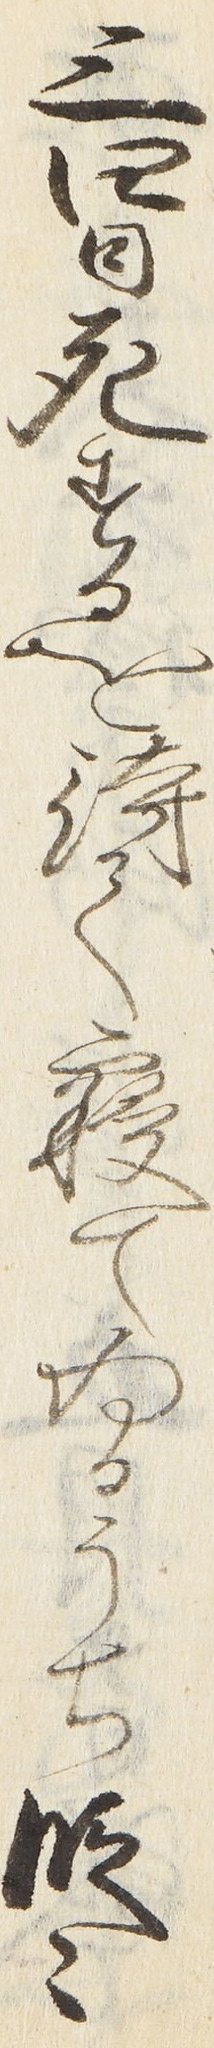三四日死するを待て寝ているうち段々
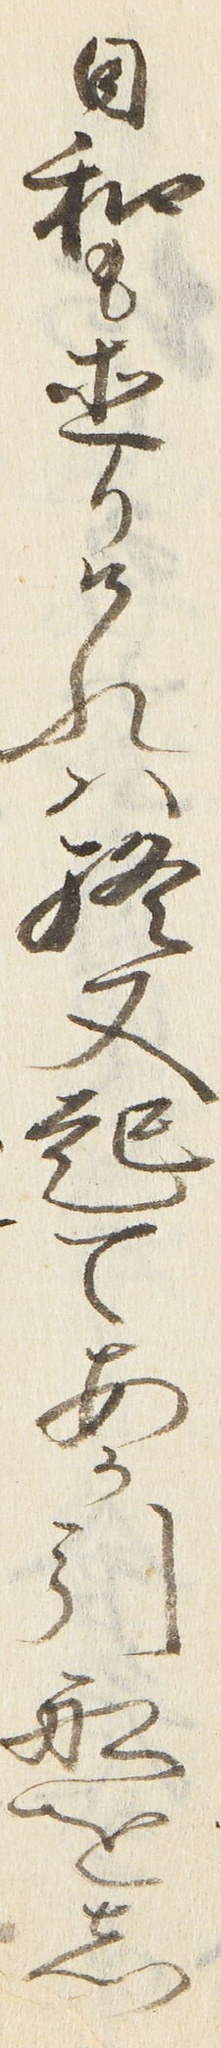日和も直りけれは終又起てあか引船をし
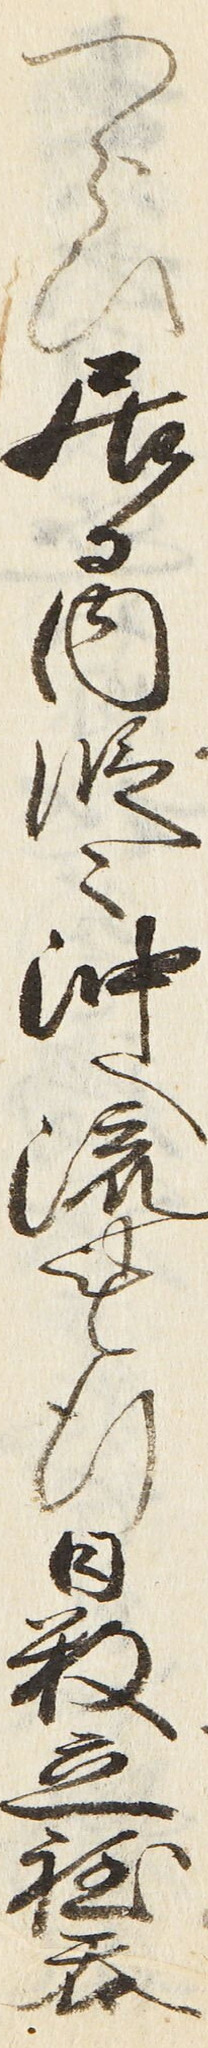つらひ居る内段々沖へ流も行日数立程呑
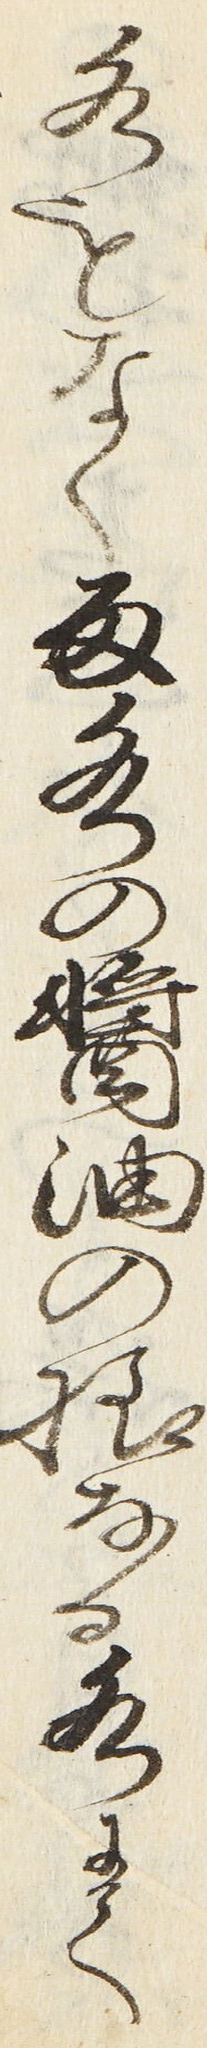水もなく雨水の醤油の様なる水にて
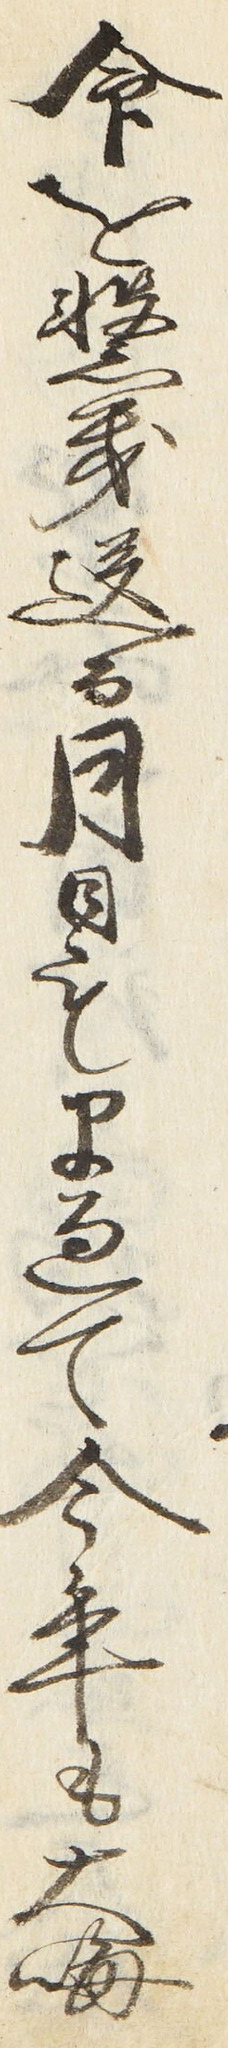命を繋義送る月日も早過て今年も大晦
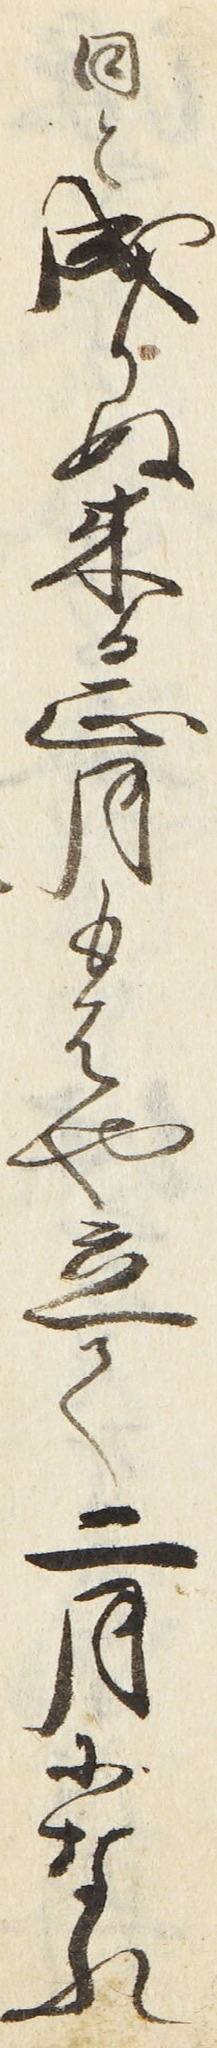日と成りぬ来る正月もはや立て二月になれ
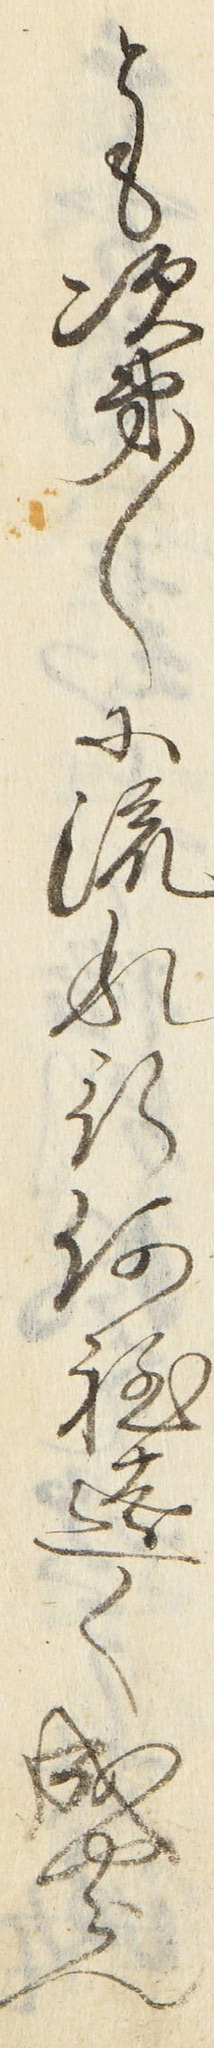とも次第〳〵に流れ行何程遠く成やらん

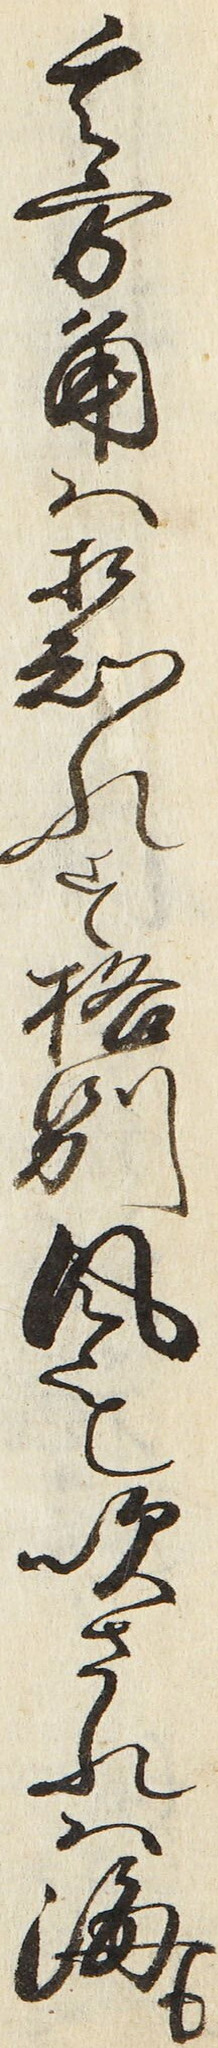其方角は相知れす格別風も吹されは海も
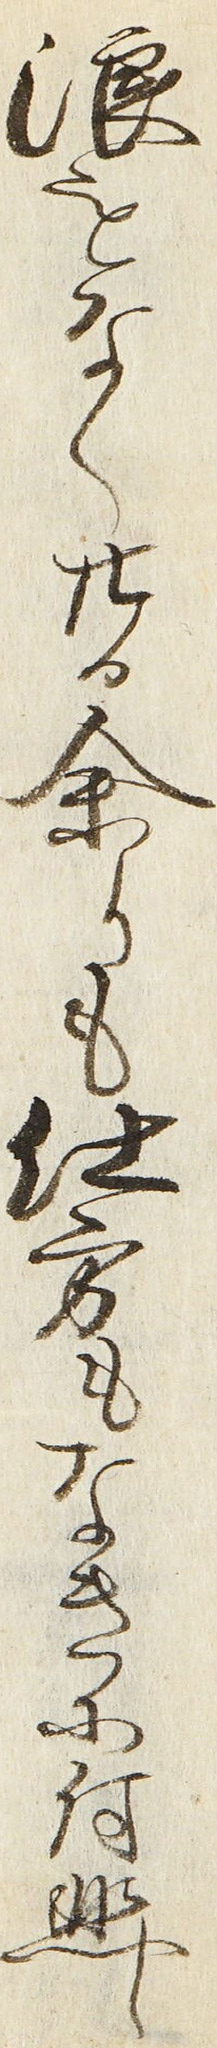浪もなく廿日余りも仕方もなきに付悲し
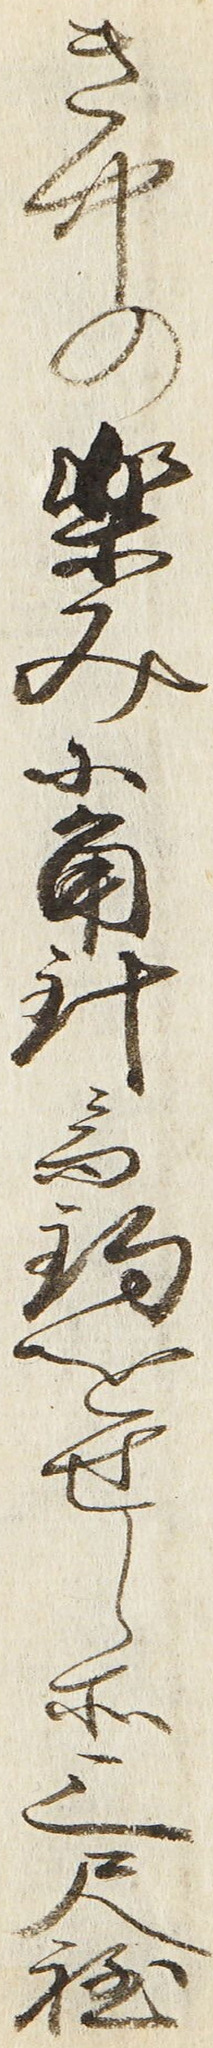き中の楽みに角針にて釣をせし所三尺程
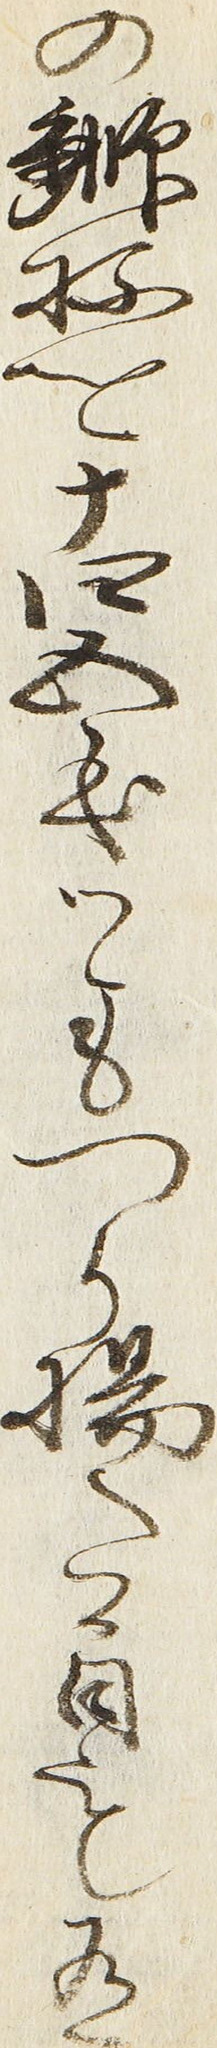の鰤抔を十四五本つゝもつり揚たる日も有
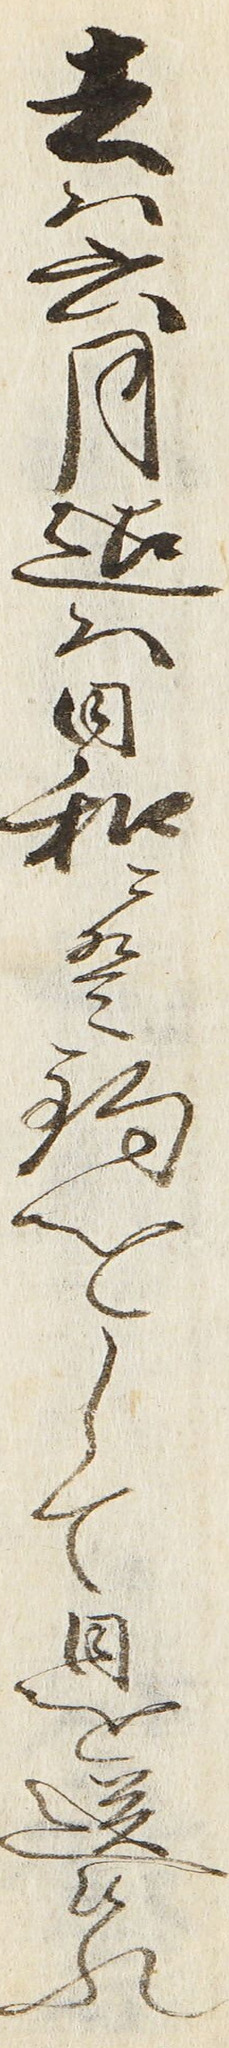去は六月迄は日和には釣をして日を送けれ
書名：天保漂流記
